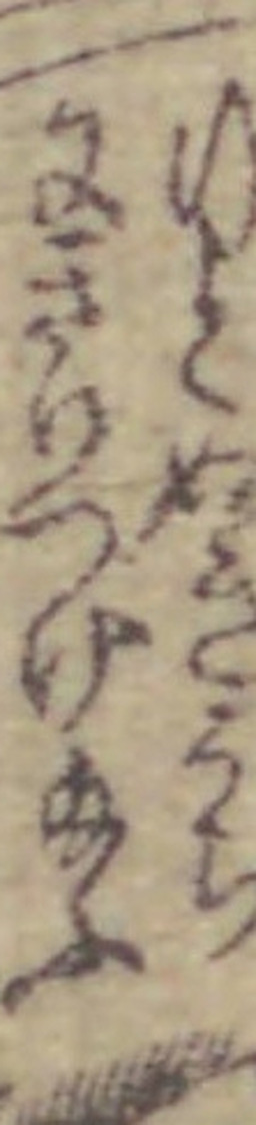にきりつけ給ふ
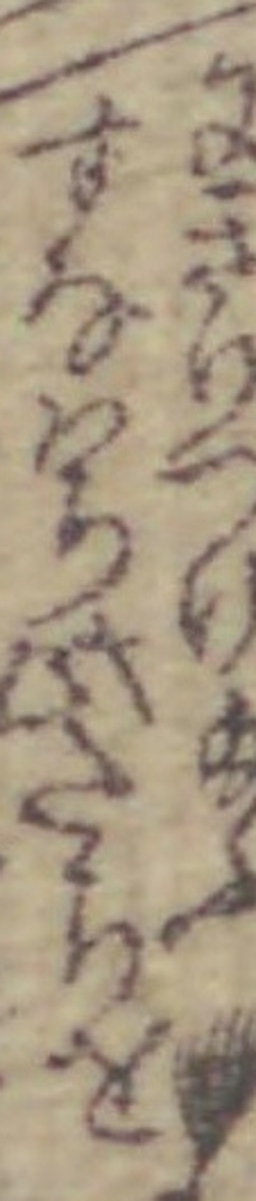すなはち此たちを
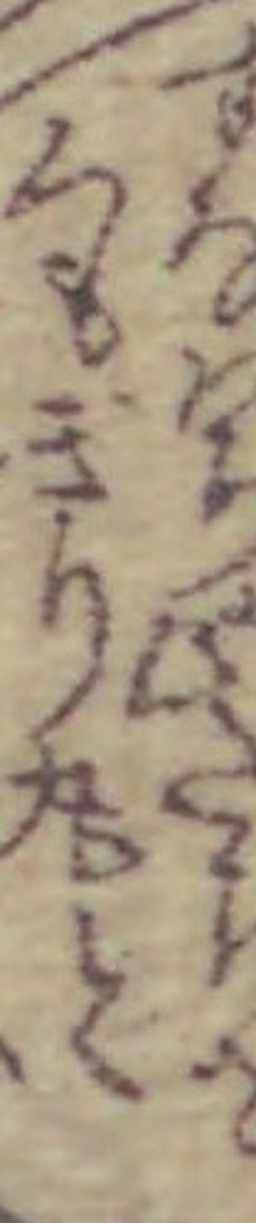くもきり丸と
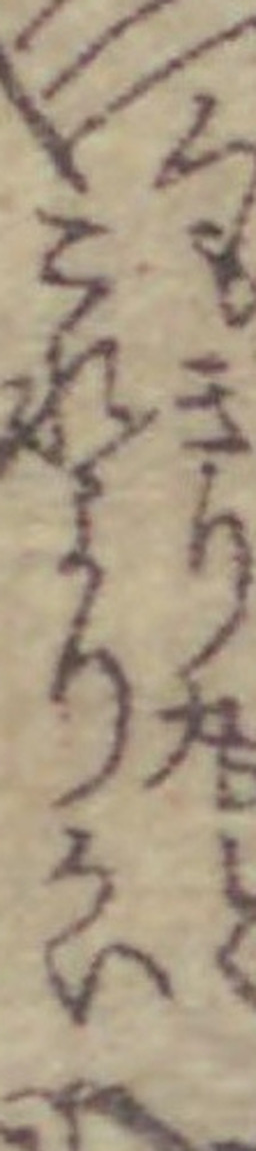これよりかい
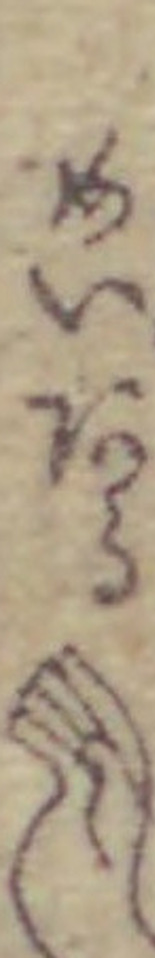めいある
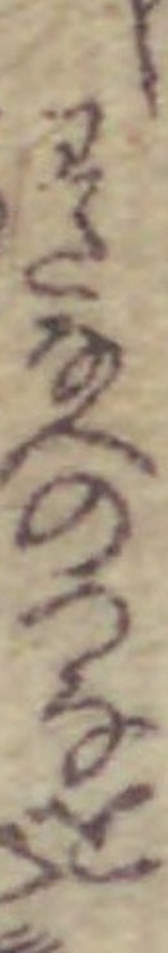わたなへのつなを
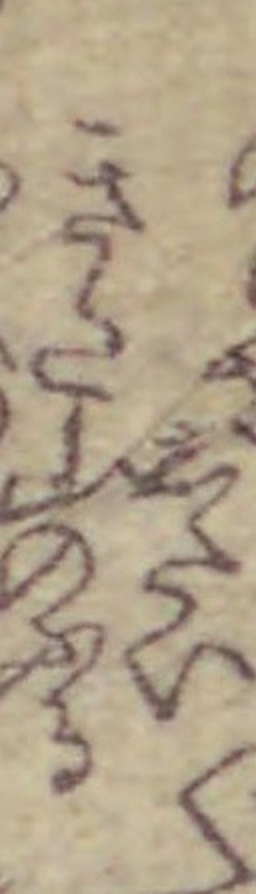きた山のふる
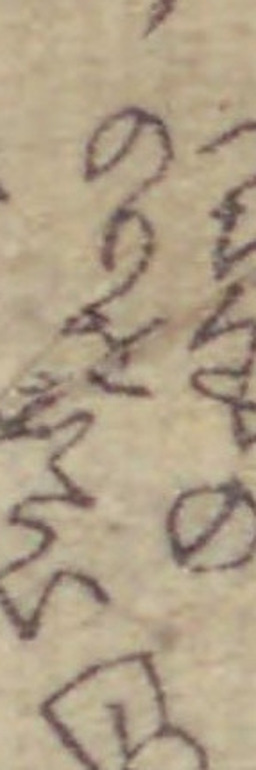くもをたい
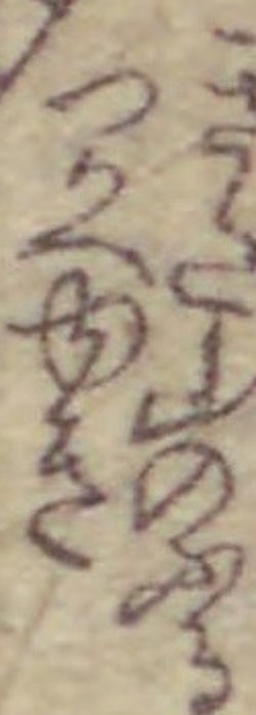つかへゆき
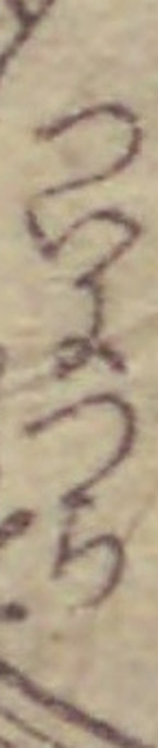ついにつち
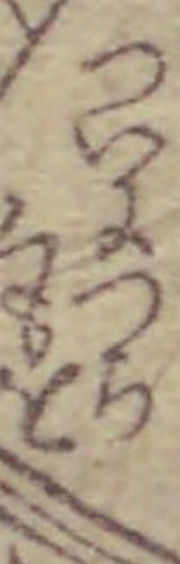ついにつち

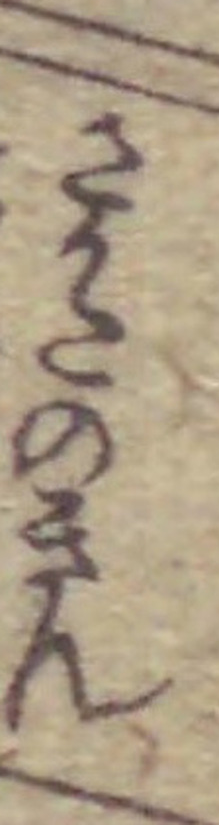さかたのきん
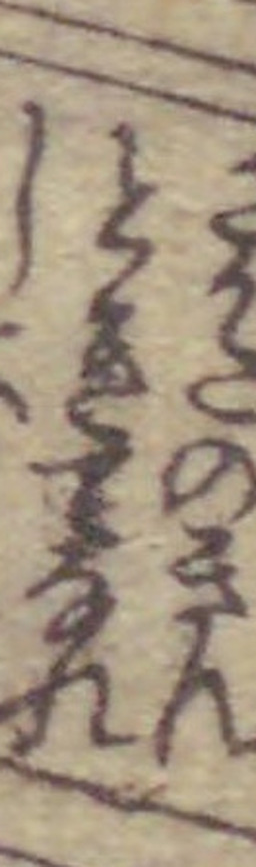ときてなれ
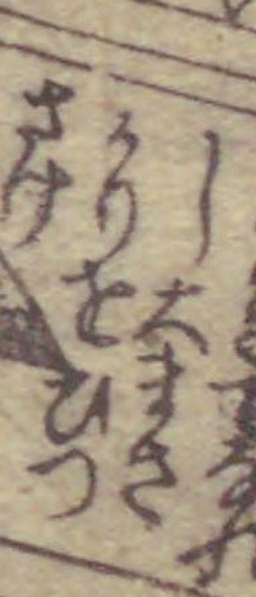かりをひつ
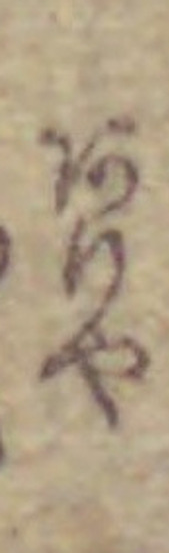ありや
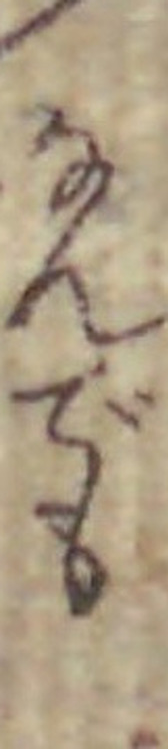なんでも
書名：とんだ茶釜 2巻
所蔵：国立国会図書館 National Diet Library, JAPAN
